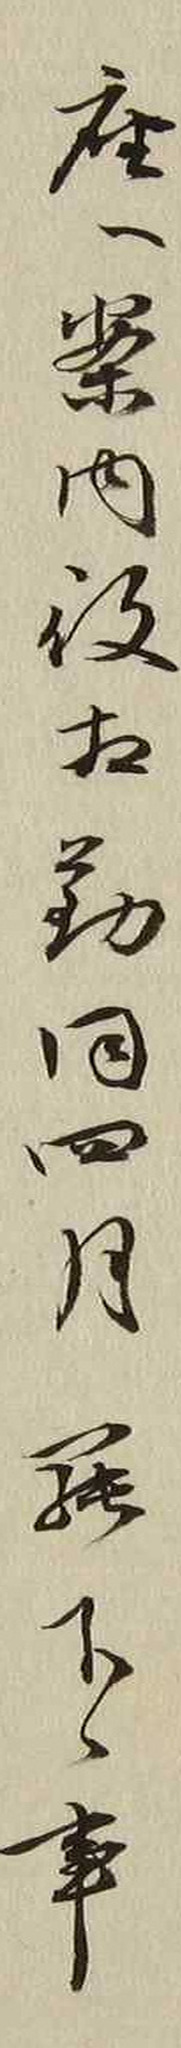座へ案内役相勤め同四月罷り候事
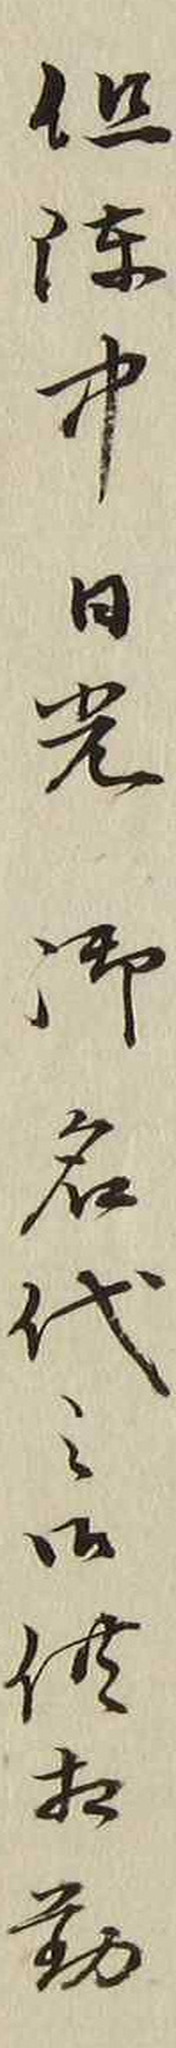但陣中日光御名代之相勤め
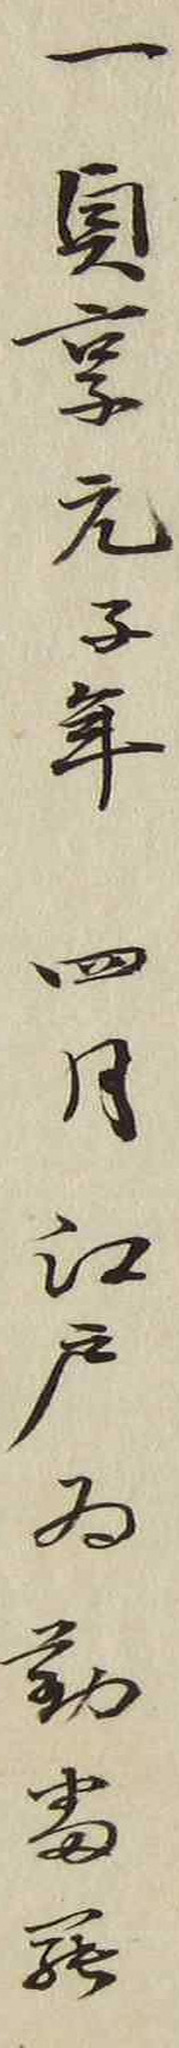一貞享元子年四月江戸勤番之為罷り

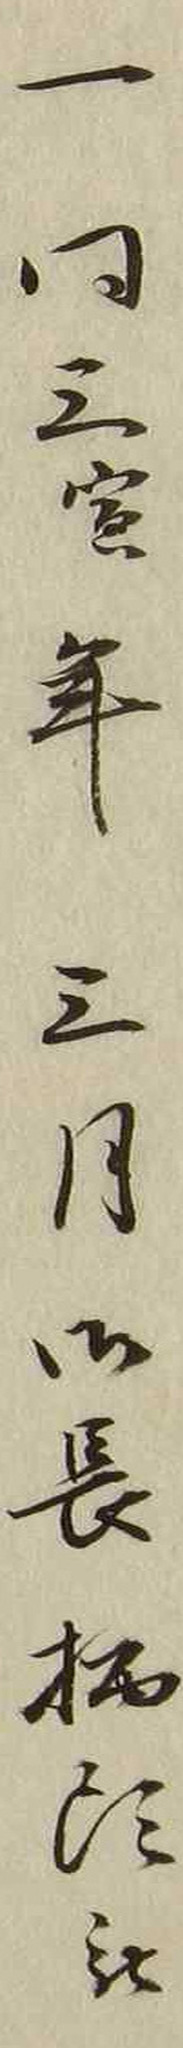一同三寅年三月御長柄頭
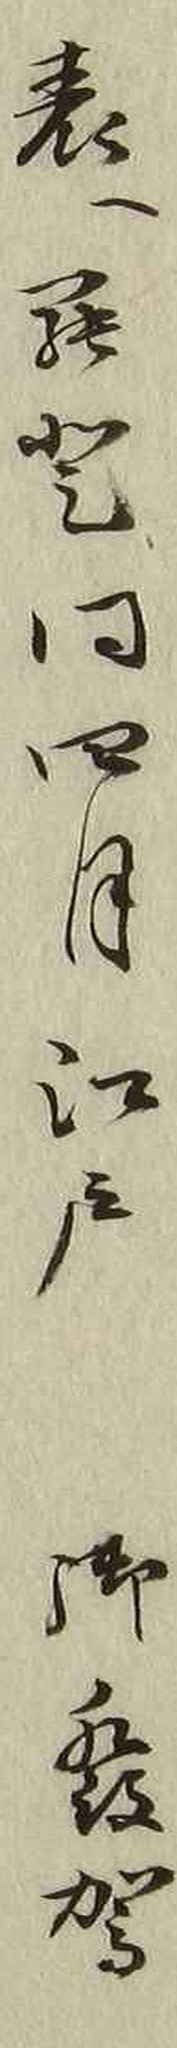表へ罷り登り同四月江戸御発駕
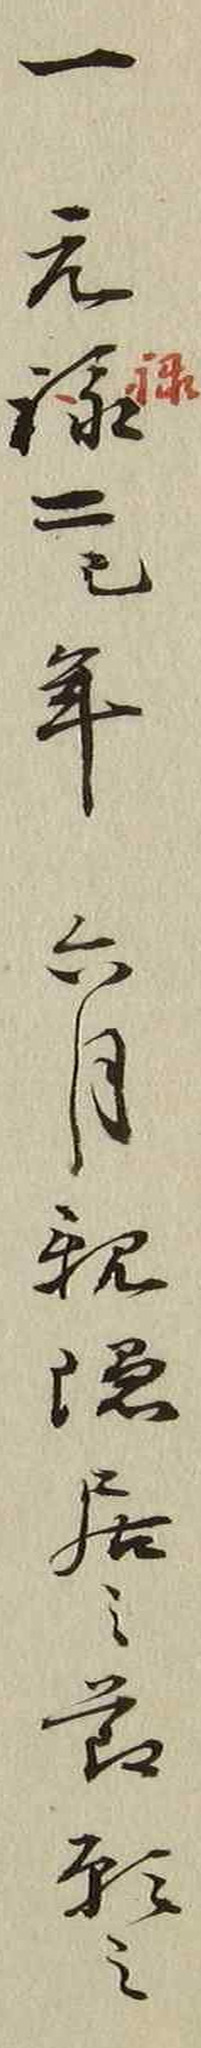一元禄二巳年六月親隠居之節願い之
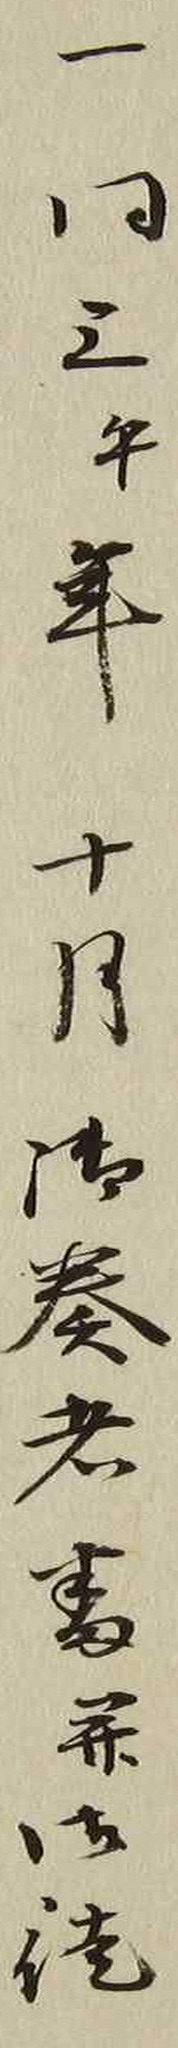一同三午年十月御奏者番幷徒歩
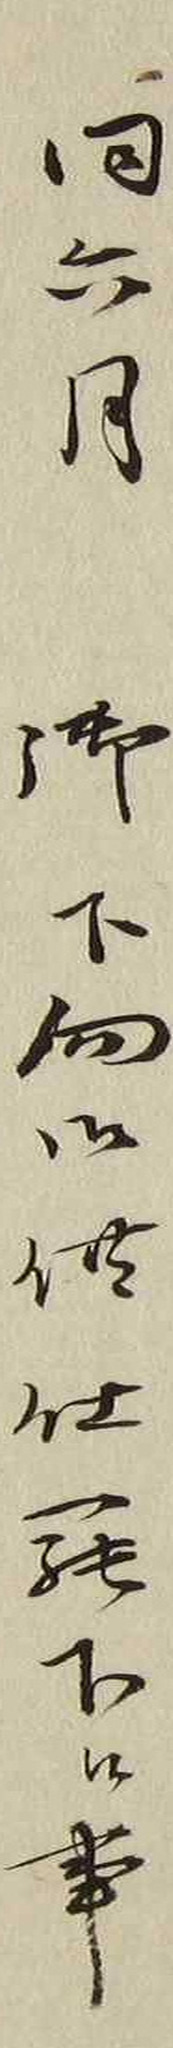同六月御下向御供仕罷り下り候事
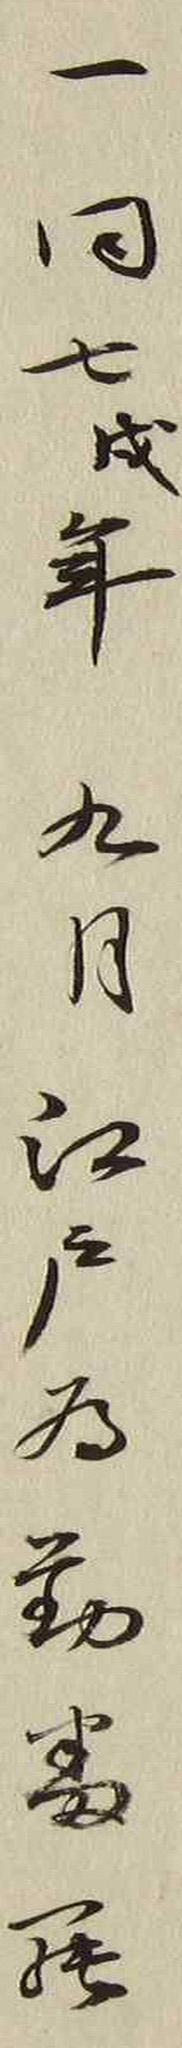一同七戌年九月江戸勤番之為罷り
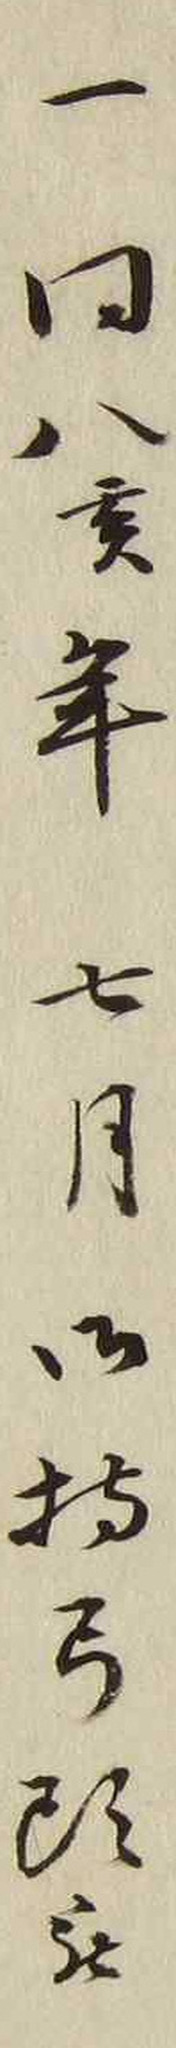一同八亥年七月御持ち弓頭

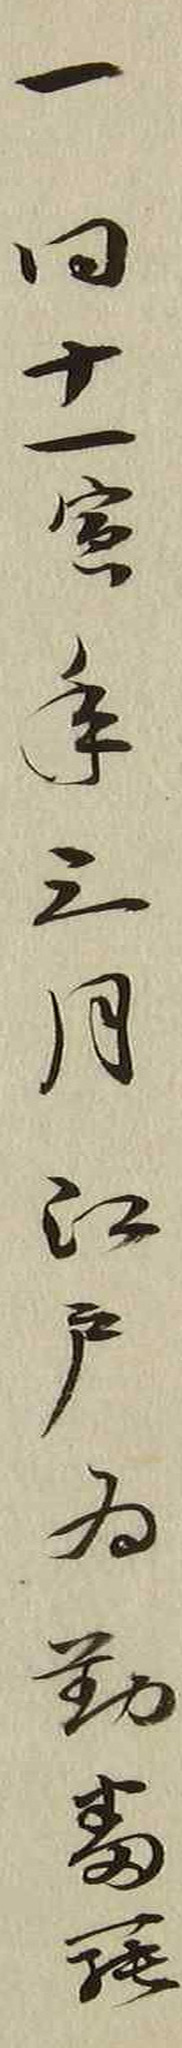一同十一寅年三月江戸勤番之為罷り
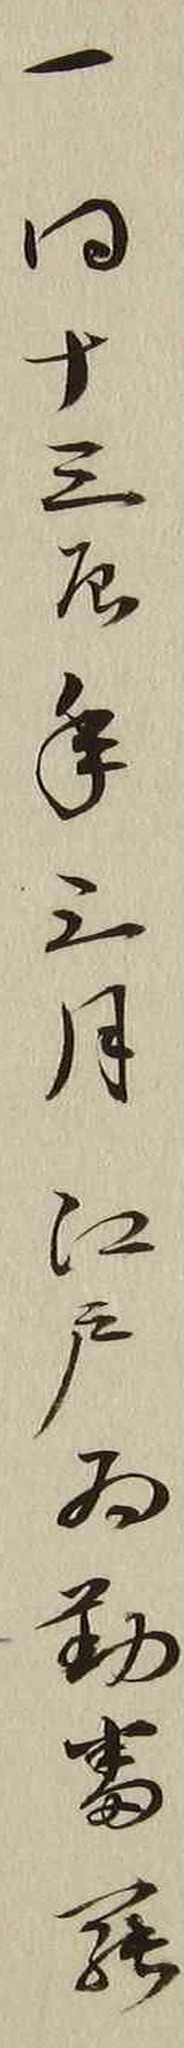一同十三辰年三月江戸勤番之為罷り
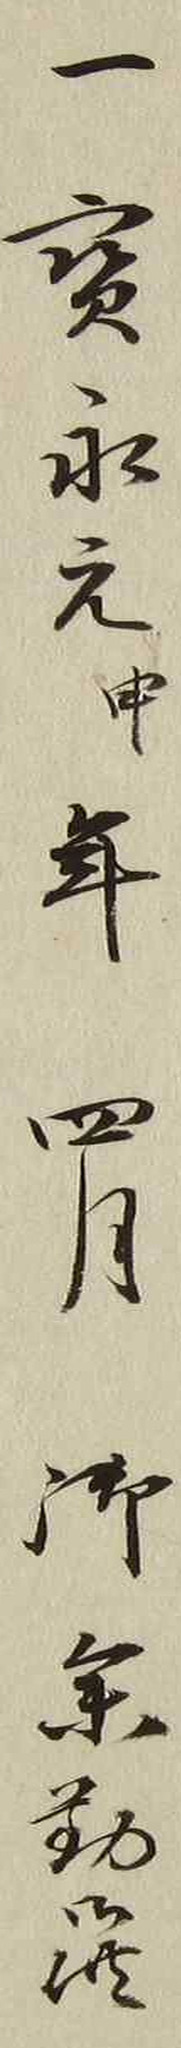一宝永元申年四月御参勤御供

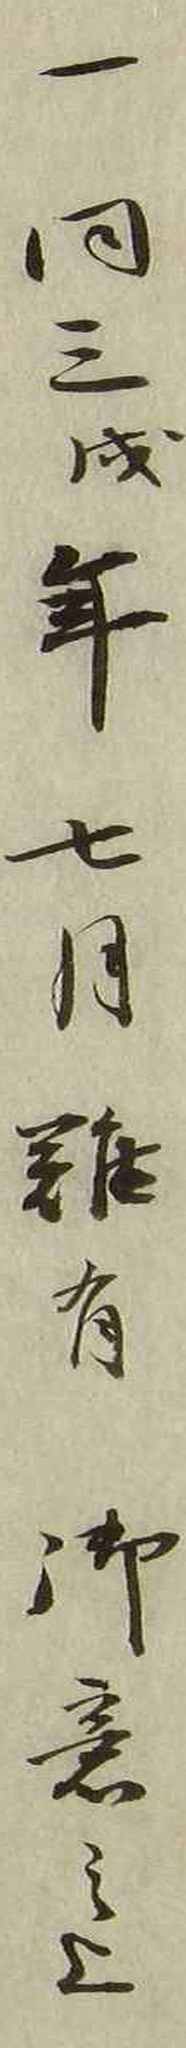一同三戌年七月有難き御意之上
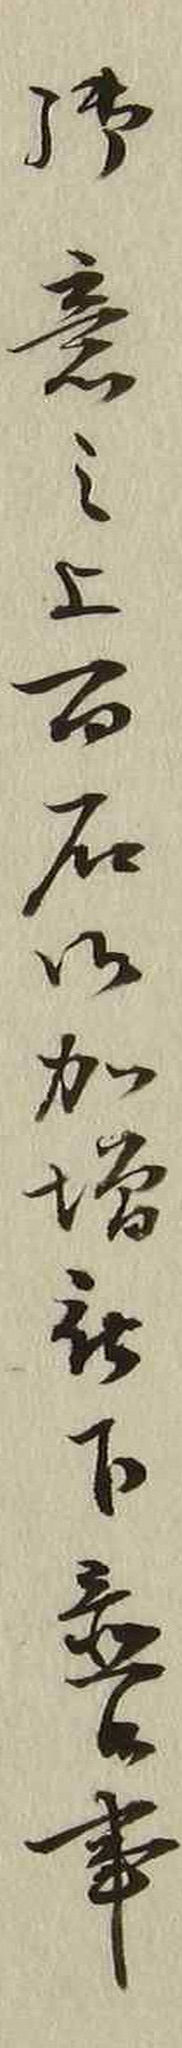御意之上百石御加増下し置かれ候事
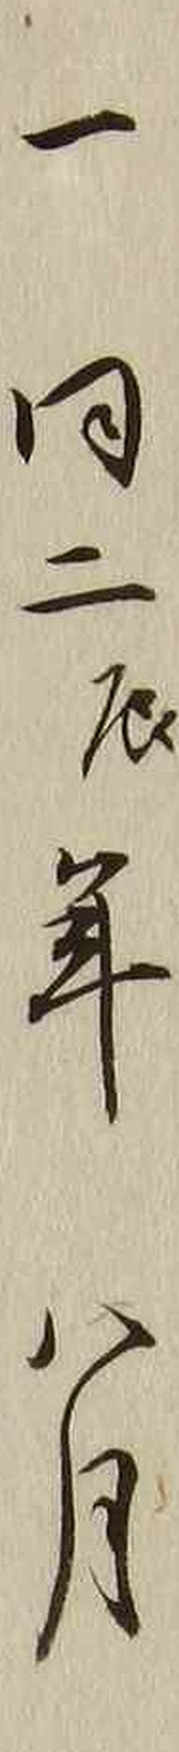一同二辰年八月
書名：諸士系譜　巻之16　い之部16
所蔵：会津若松市立会津図書館
